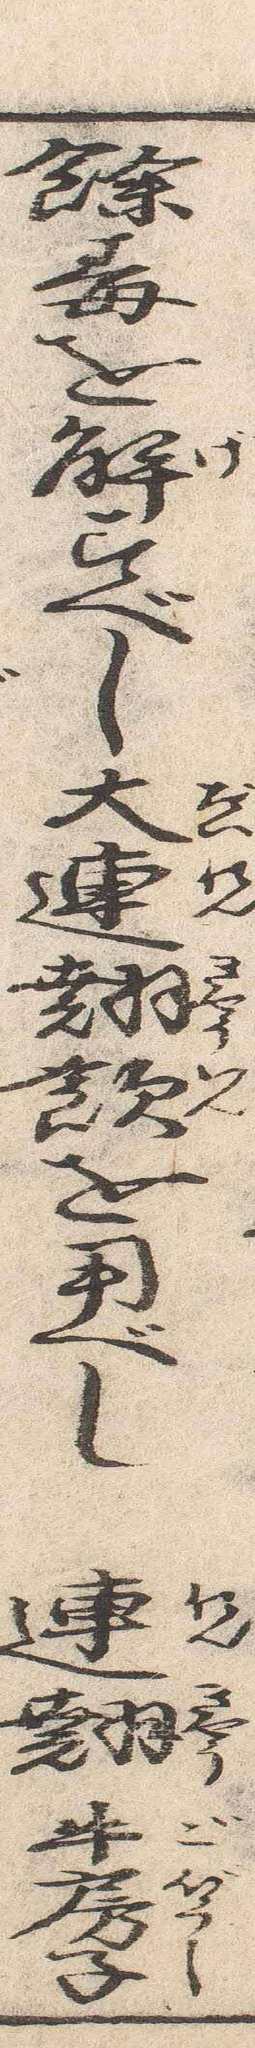余毒を解すべし大連翹飲を用べし連翹牛房子
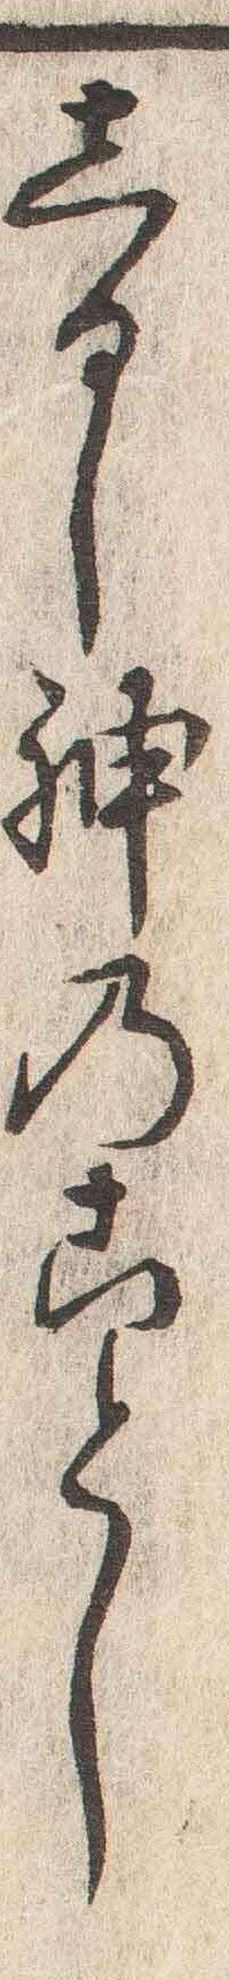しるし神のことし
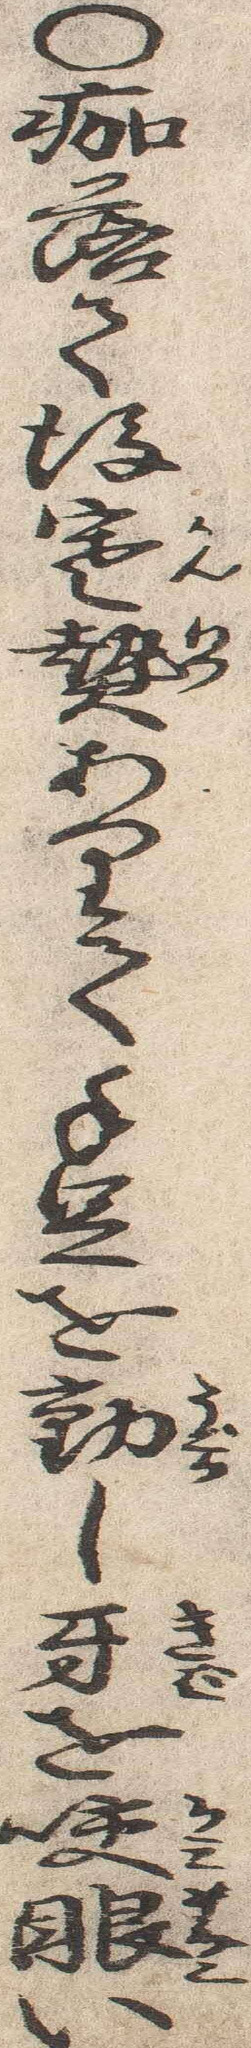○痂落て後寒熱ありて手足を動し牙を咬眼い
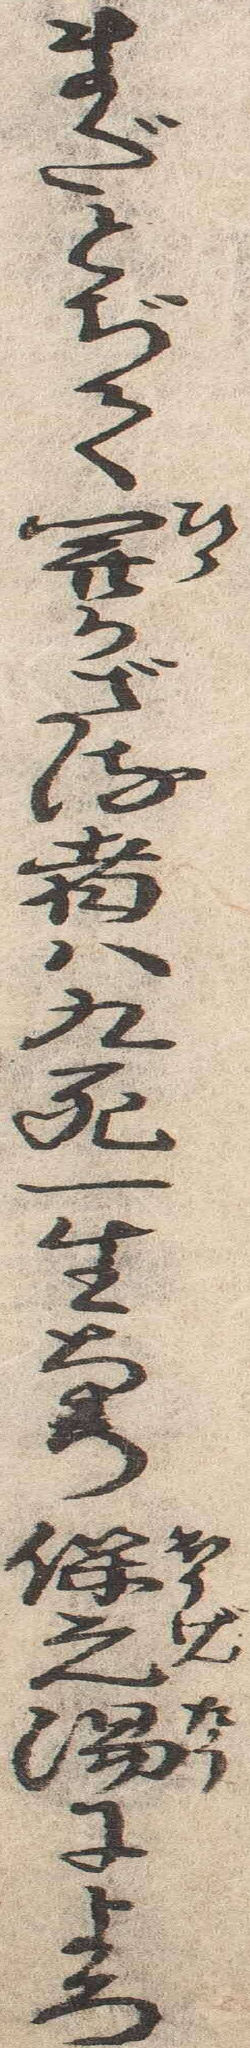まだとぢて開かざる者は九死一生なり保元湯によろ
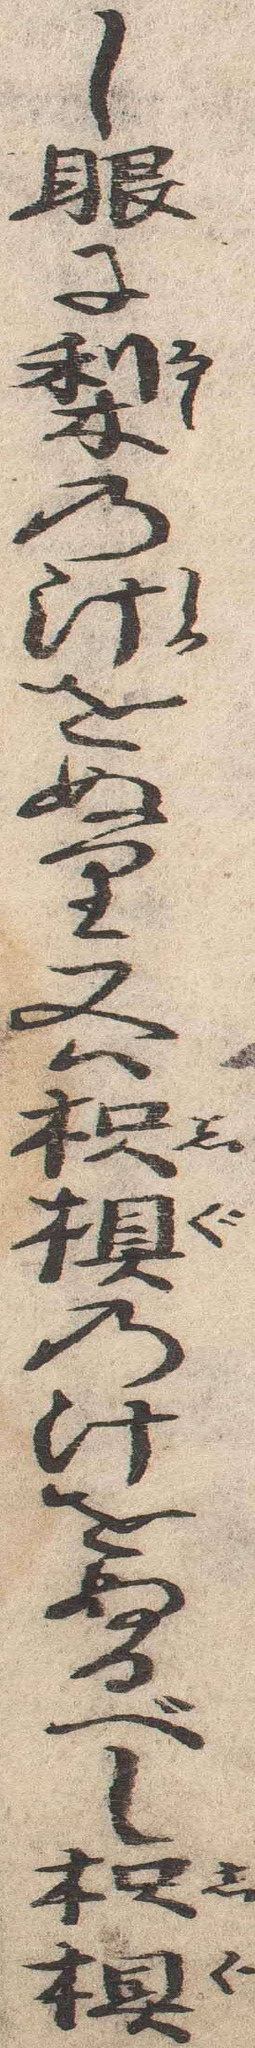し眼に梨の汁をぬり又は枳椇の汁をぬるべし枳椇

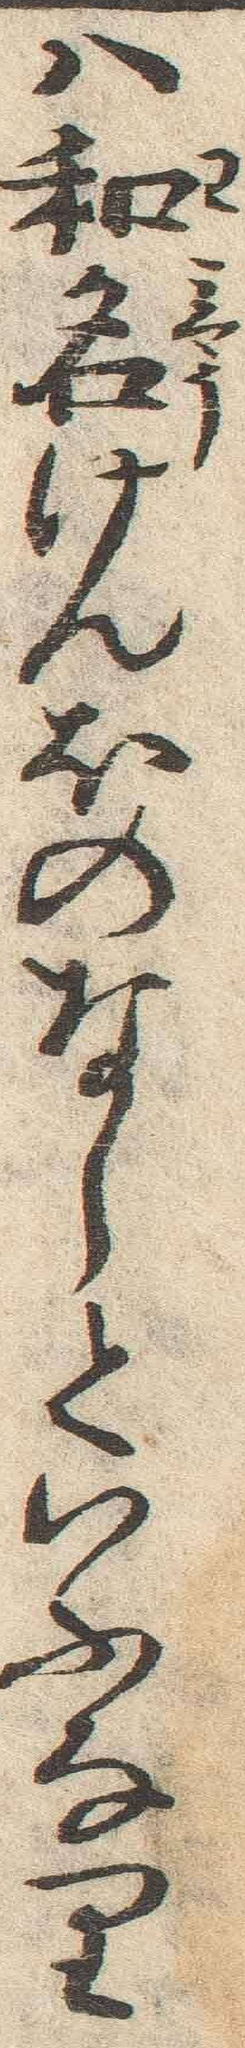は和名けんほのなしといふなり
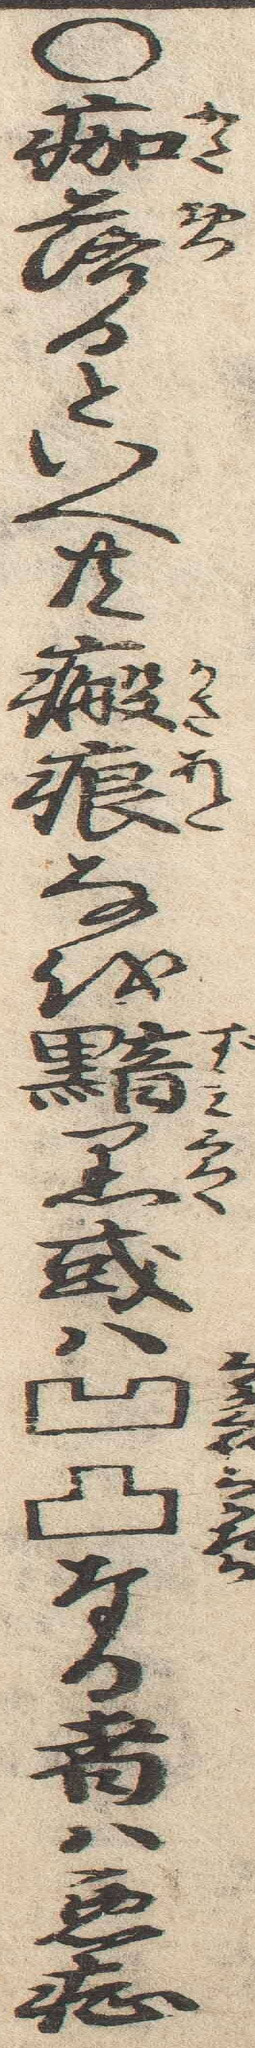○痂落るといへ共瘢痕なを黯黒或は凹凸なる者は悪症
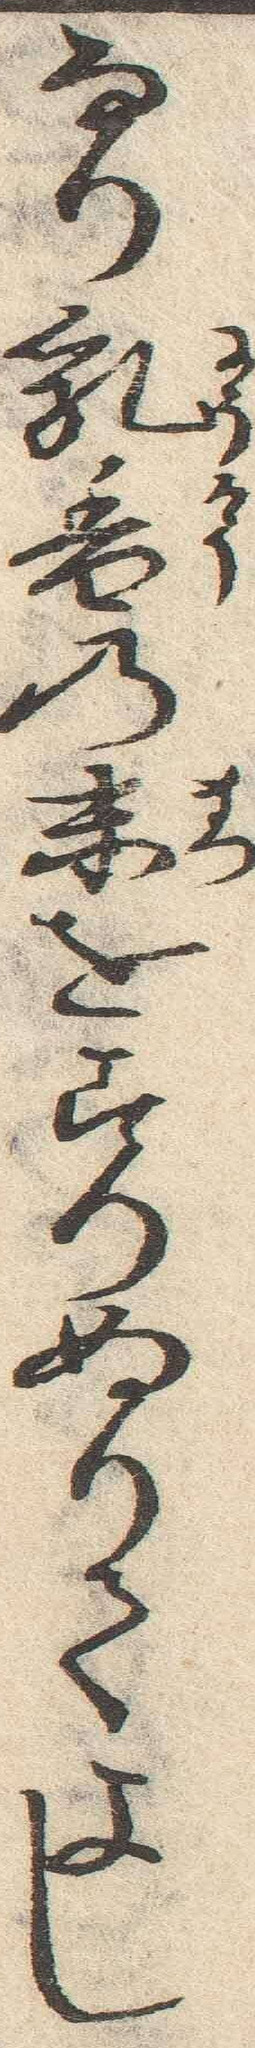なり乳香の末をすりぬりてよし
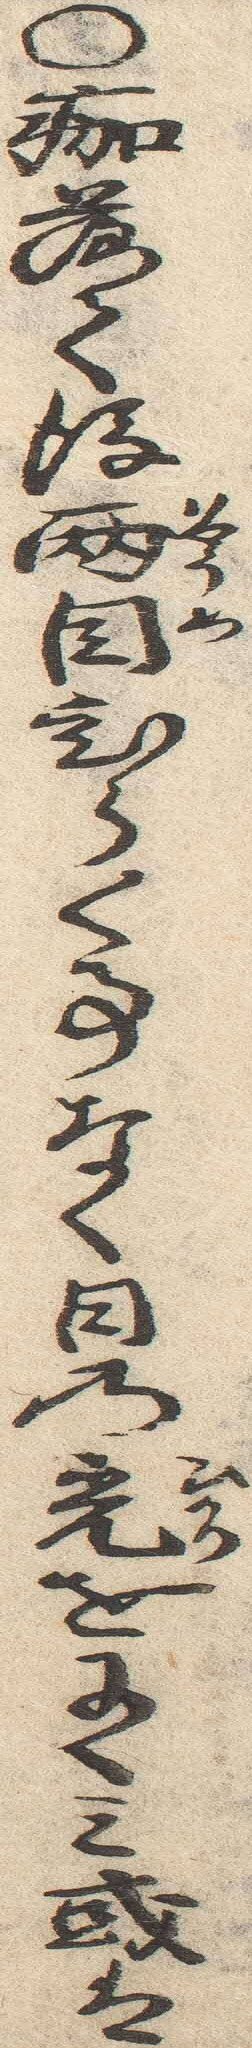○痂落て後両目ひらく事なく日の光をにくみ或は
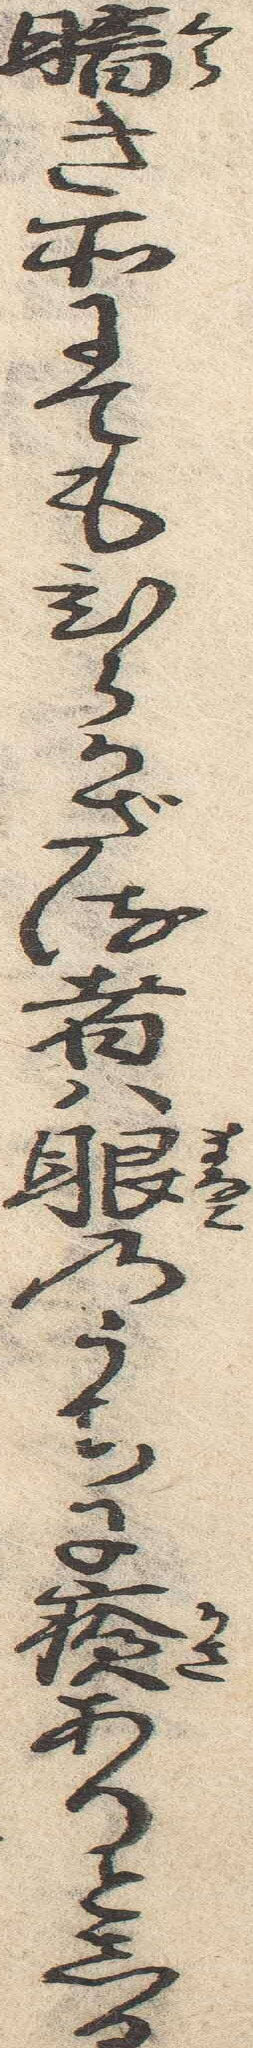暗き所にてもひらかざる者は眼のうちに瘡ありとしる
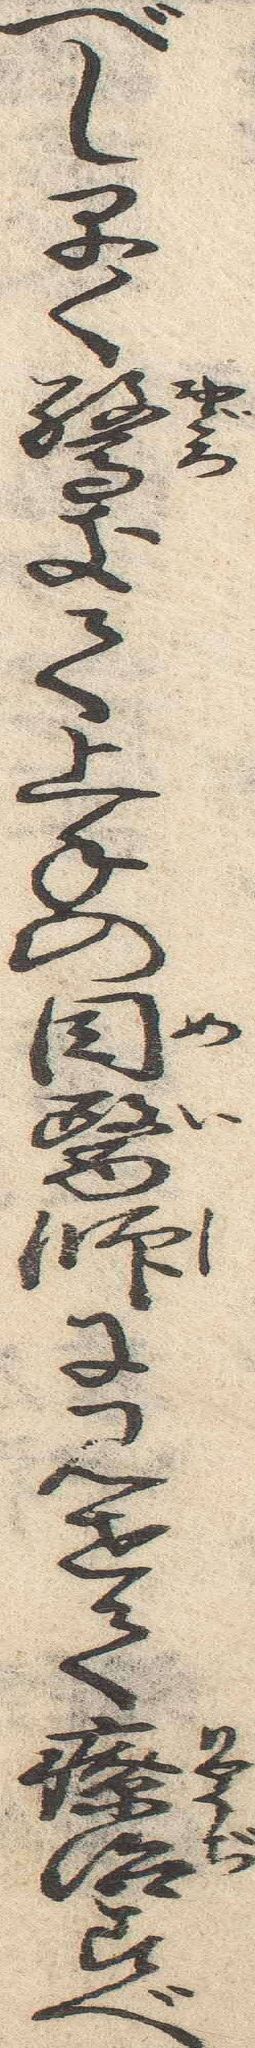べし早く驚きて上手の目医師に見せて療治すべ
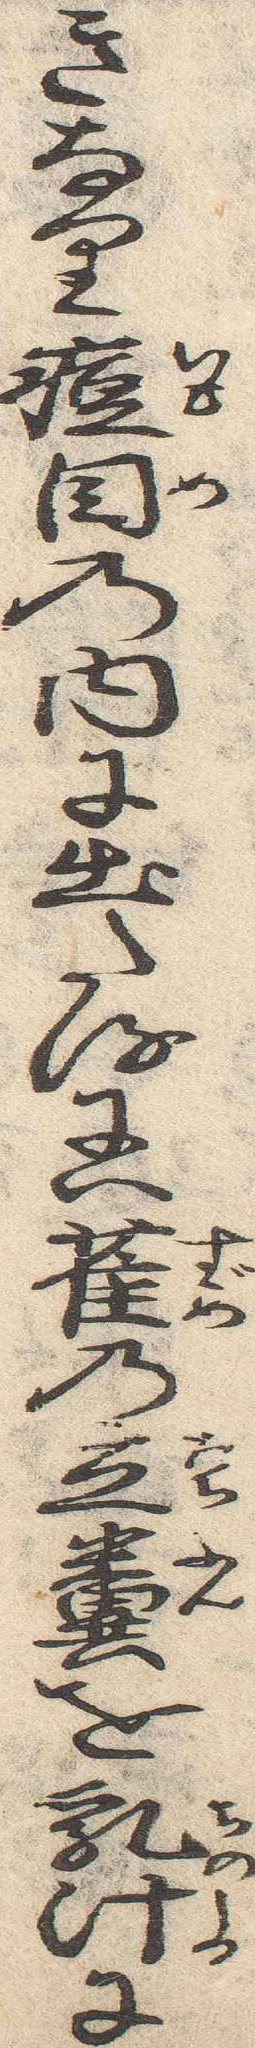きなり痘目の内に出たるには雀の立糞を乳汁に
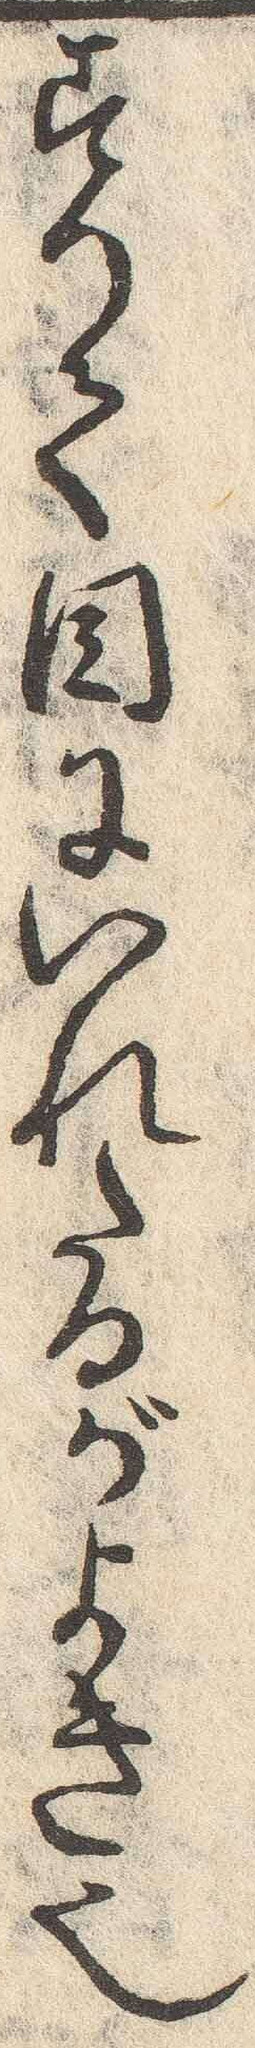すりて目にいれたるがよき也
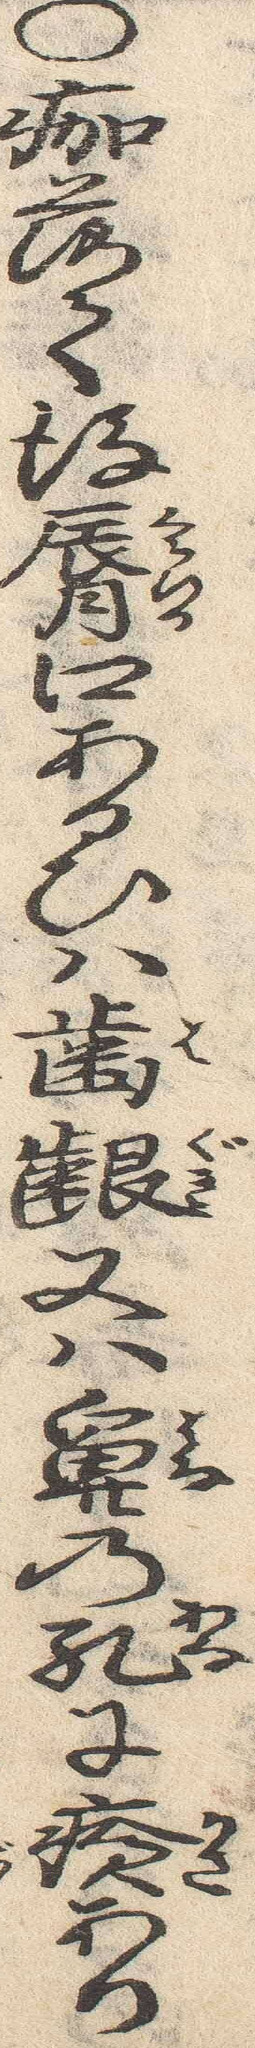○痂落て後唇口あるひは歯齦又は鼻の孔に瘡あり
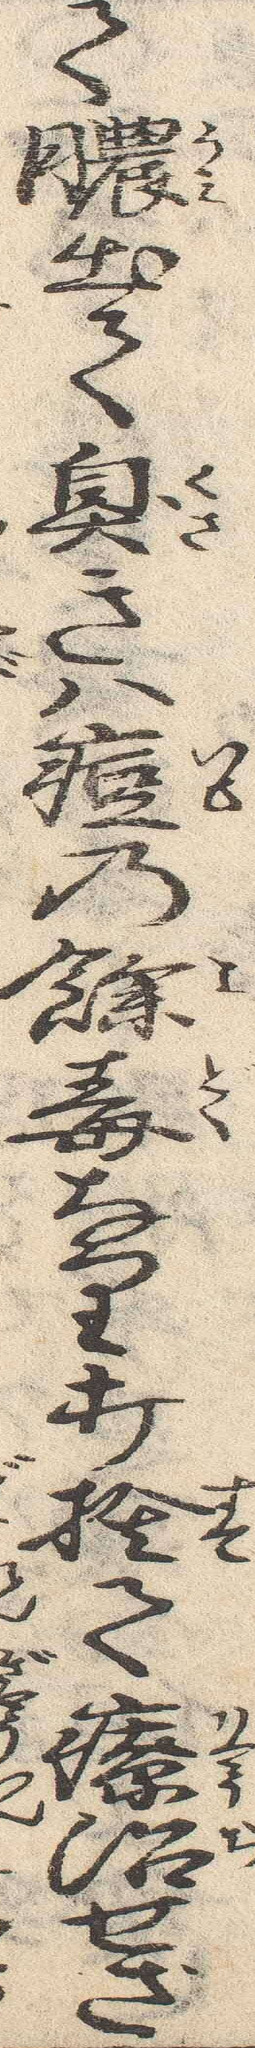て膿出て臭きは痘の余毒なり打捨て療治せざ
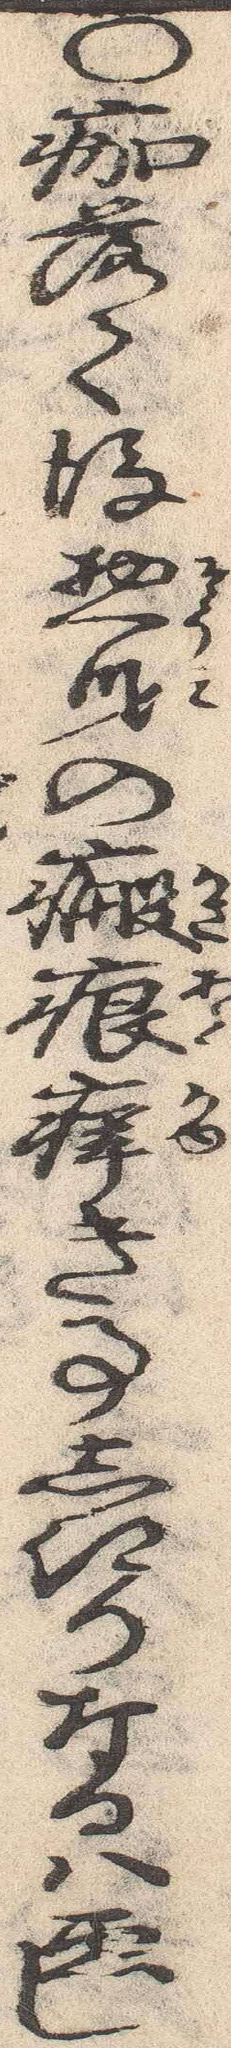○痂落て後総身の瘢痕痒き事しきりなるは悪し
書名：小児必用養育草
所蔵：東京学芸大学附属図書館 国文学研究資料館
